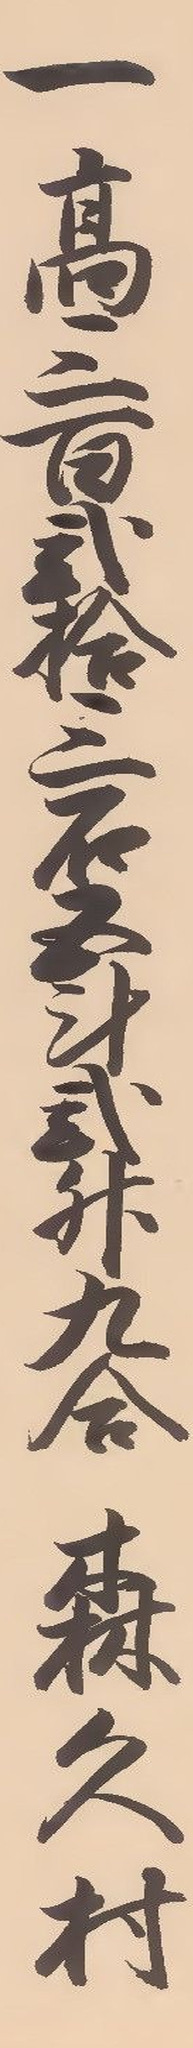一髙三百弐拾三石五斗弐升九合森久村
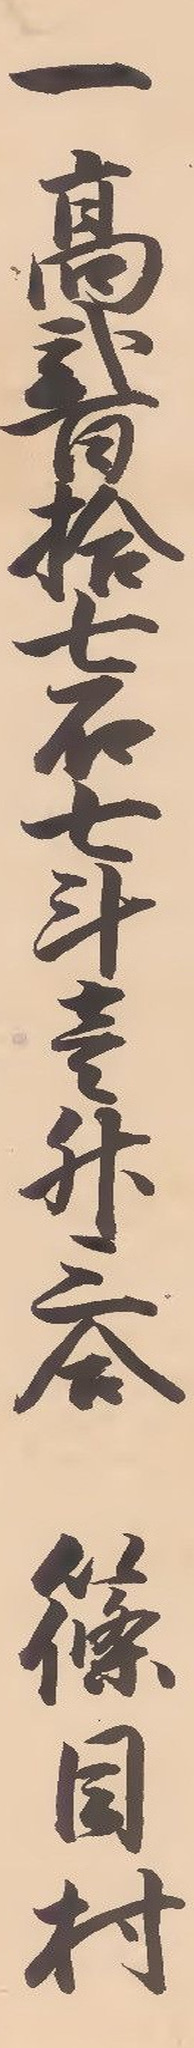一髙弐百拾七石七斗壱升三合篠目村

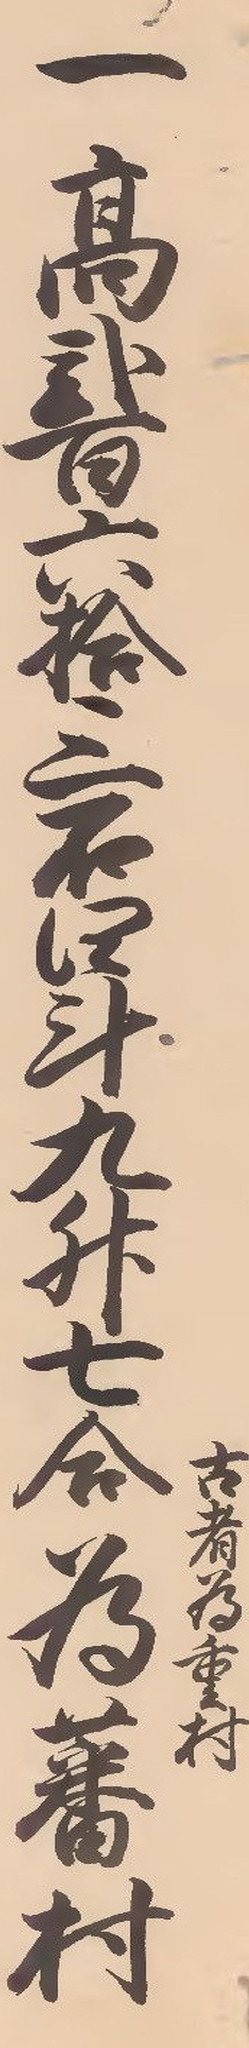一髙弐百六拾三石四斗九升七合為蕃村
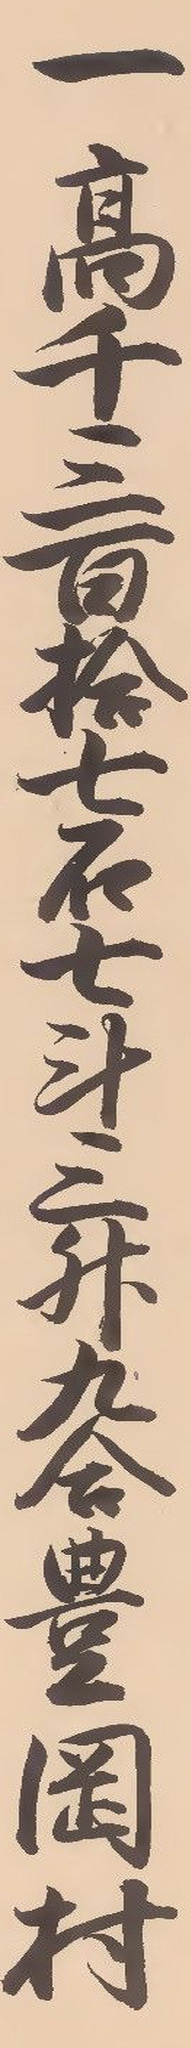一髙千三百拾七石七斗三升九合豊岡村
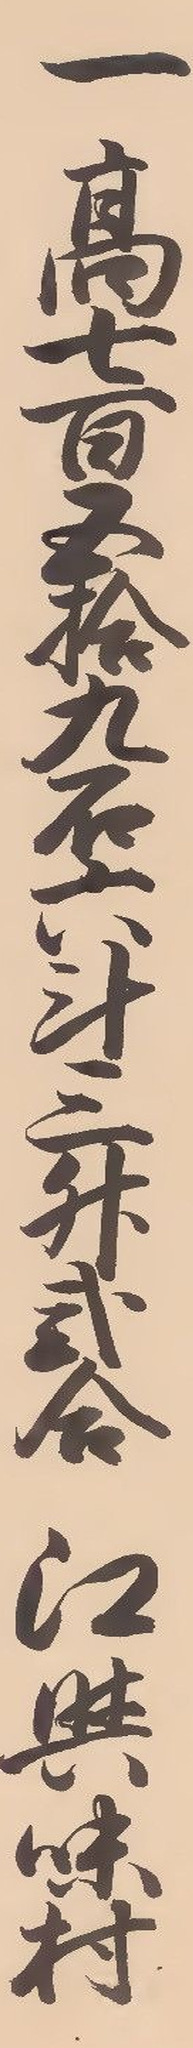一髙七百五拾九石六斗三升弐合江與味村
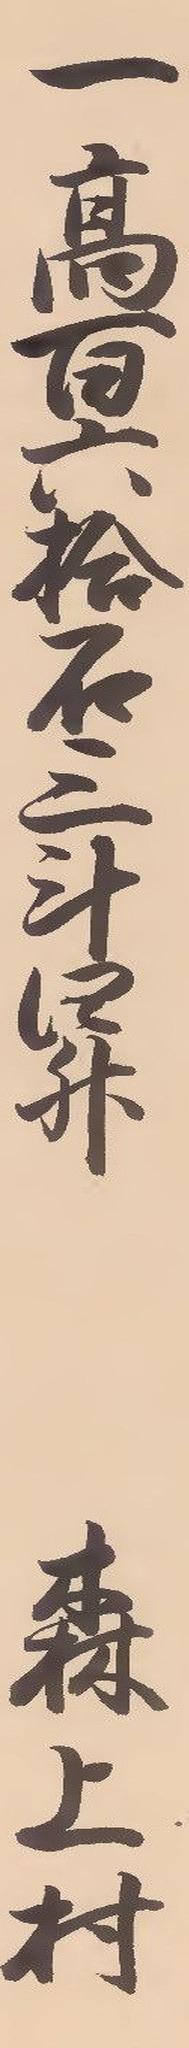一髙百六拾石三斗四升森上村
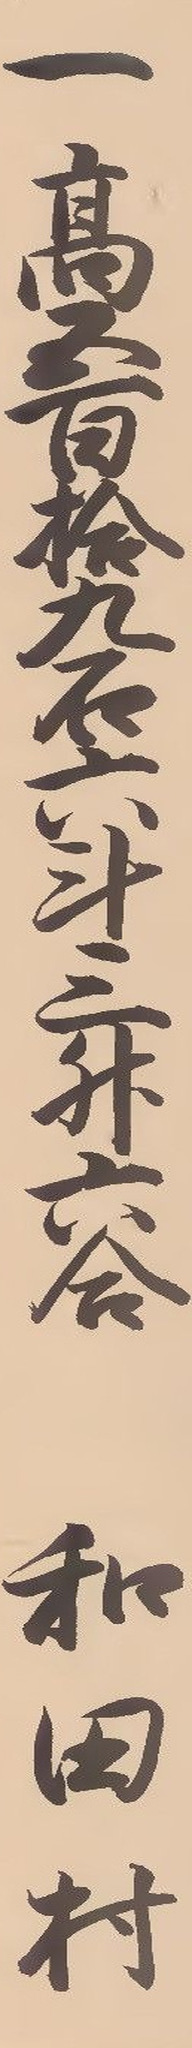一髙五百拾九石六斗三升六合和田村
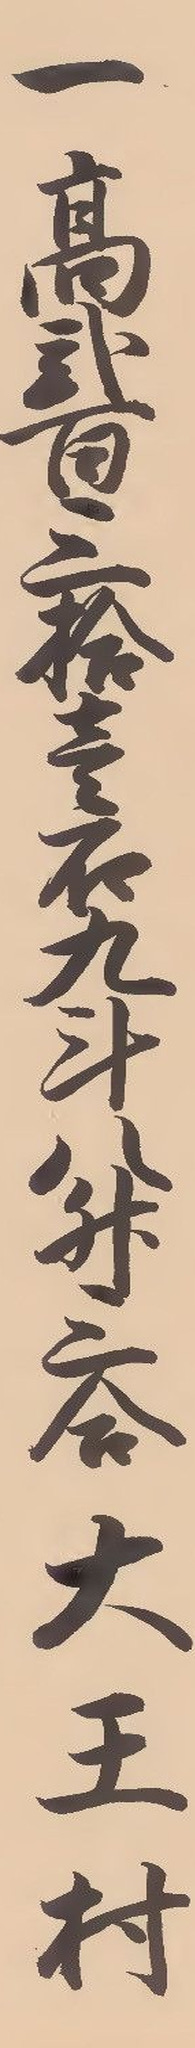一髙弐百三拾壱石九斗八升三合大王村
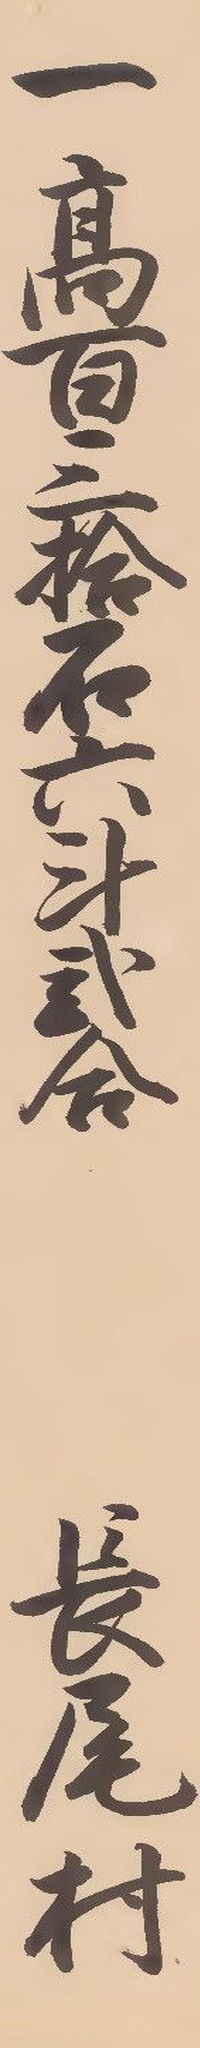一髙百三拾石六升弐合長尾村
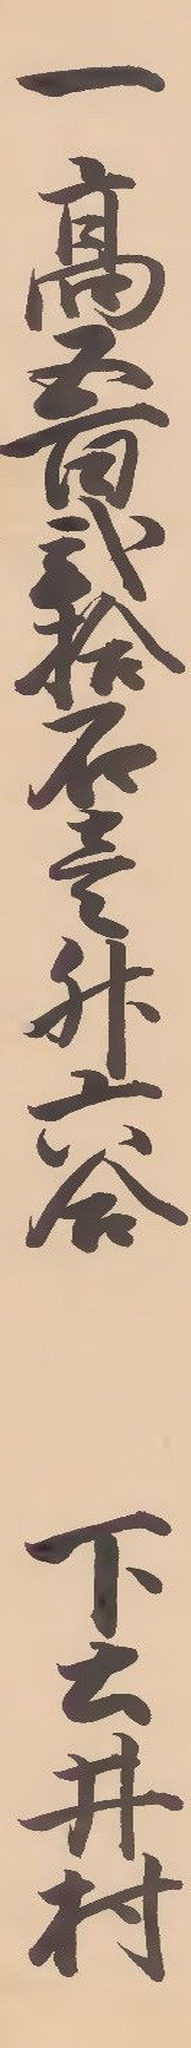一髙五百弐拾石壱升六合下土井村

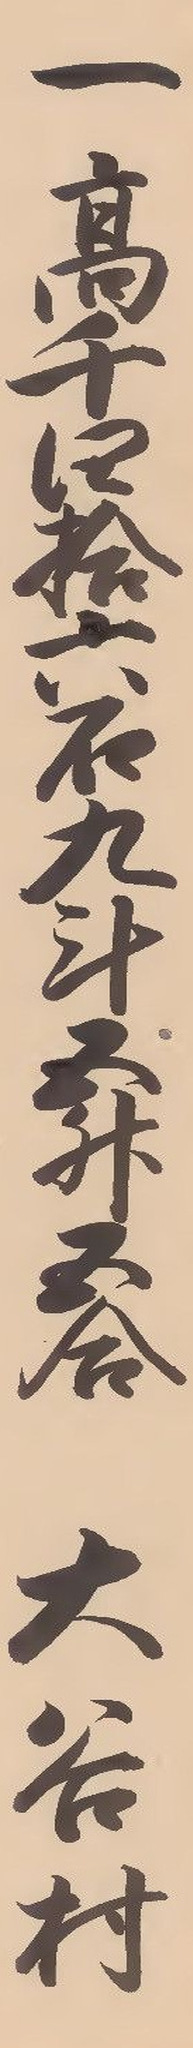一髙千四拾六石九斗五升五合大谷村
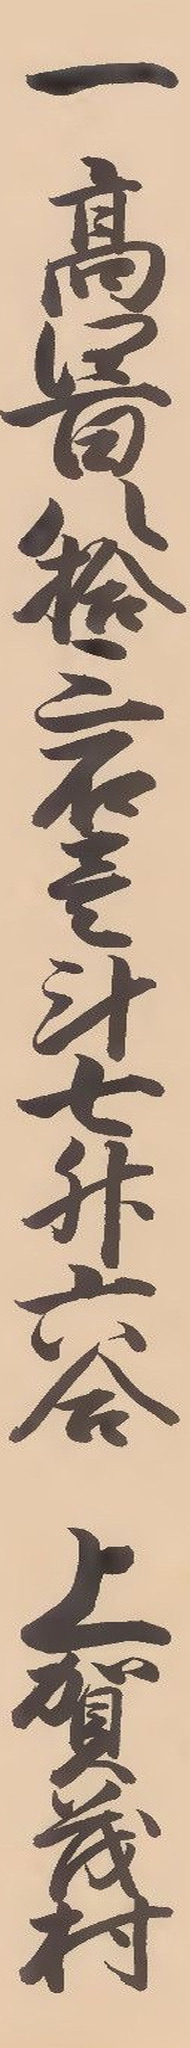一髙四百八拾三石壱斗七升六合上賀茂村
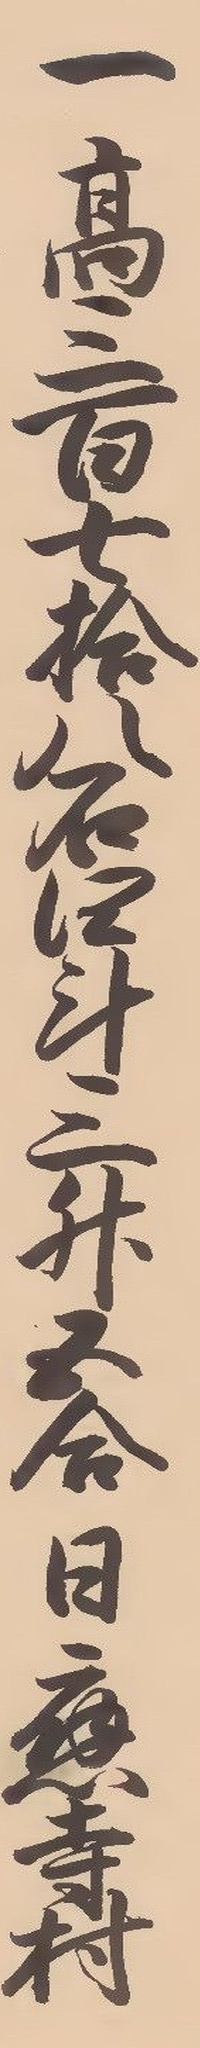一髙三百七拾八石四斗三升五合日應寺村
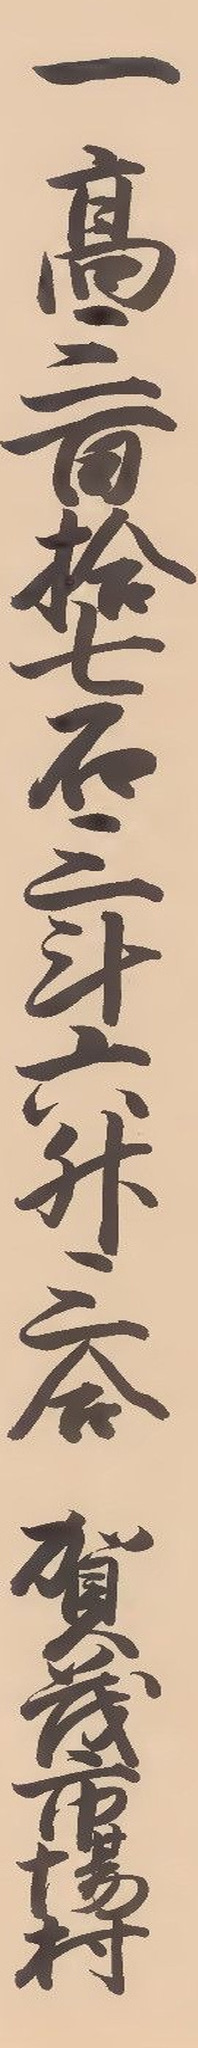一髙三百拾七石三斗六升三合賀茂市場村
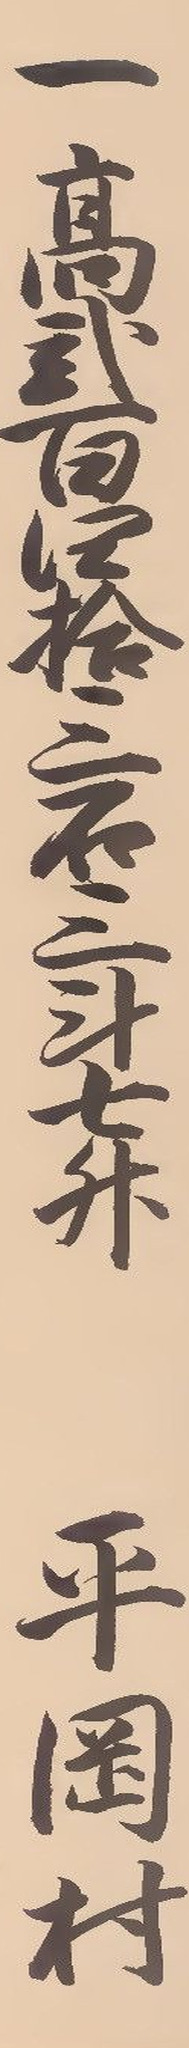一髙弐百四拾三石三斗七升平岡村
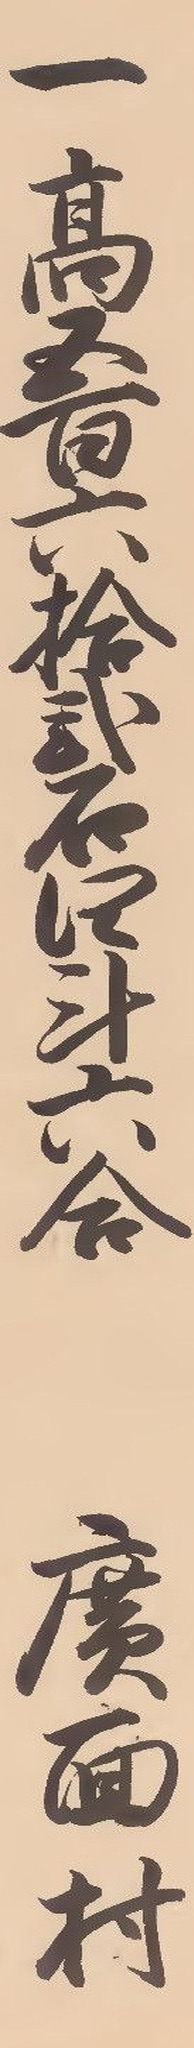一髙五百六拾弐石四斗六合廣面村
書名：備前国郷帳
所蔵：国立公文書館 National Archives of Japan
